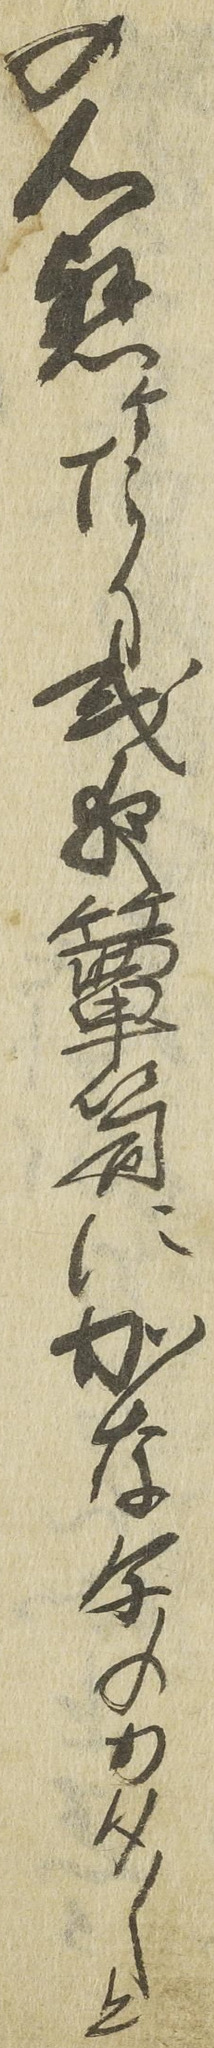の心懸ケなり或夜簞笥にかな字のカタ〳〵と
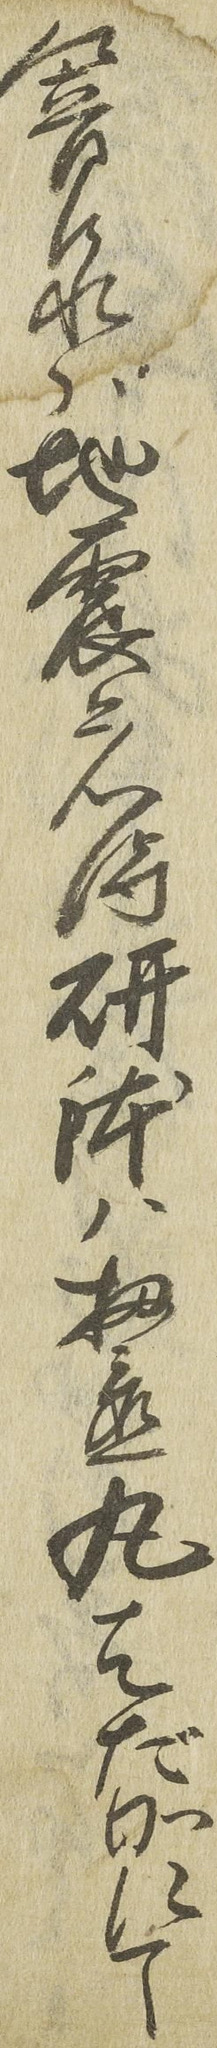響けれバ地震と心得研鉢ハ扨置丸はだかにて
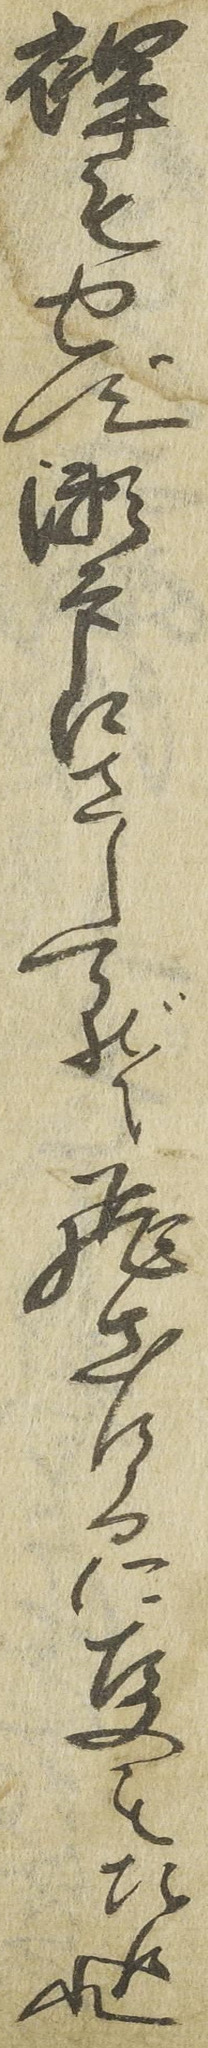褌もせず瀬戸にさしてぞ飛出けるに事もなけれ
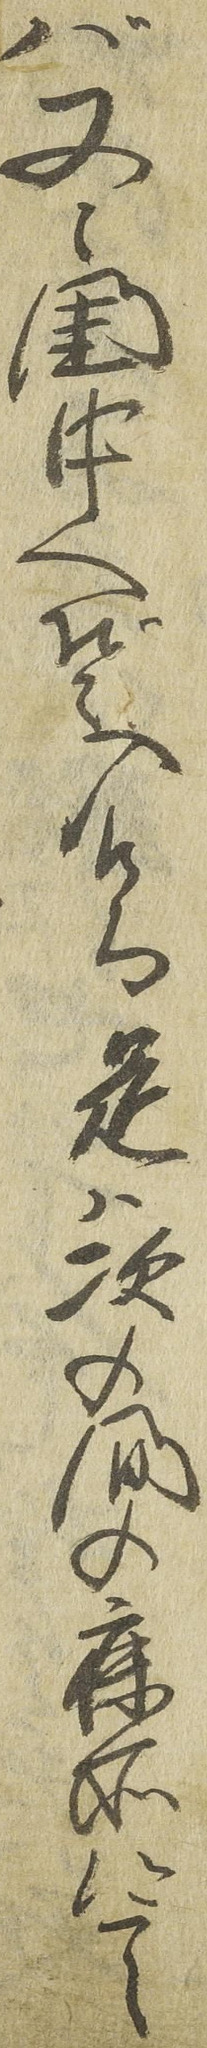バ又々閨中へぞ入ける是ハ次の間の寝所にて
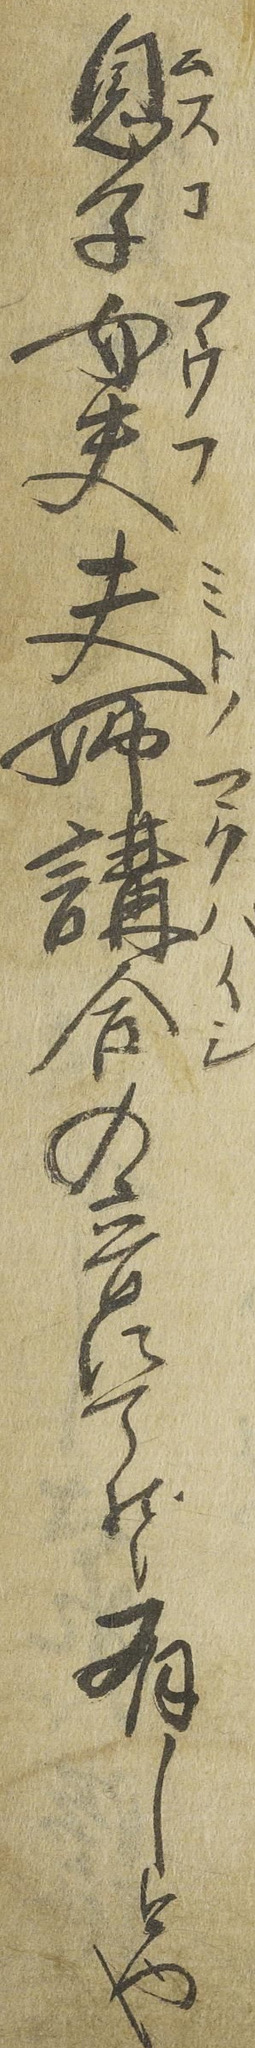息子女夫夫婦講合の音にてぞ有しと也

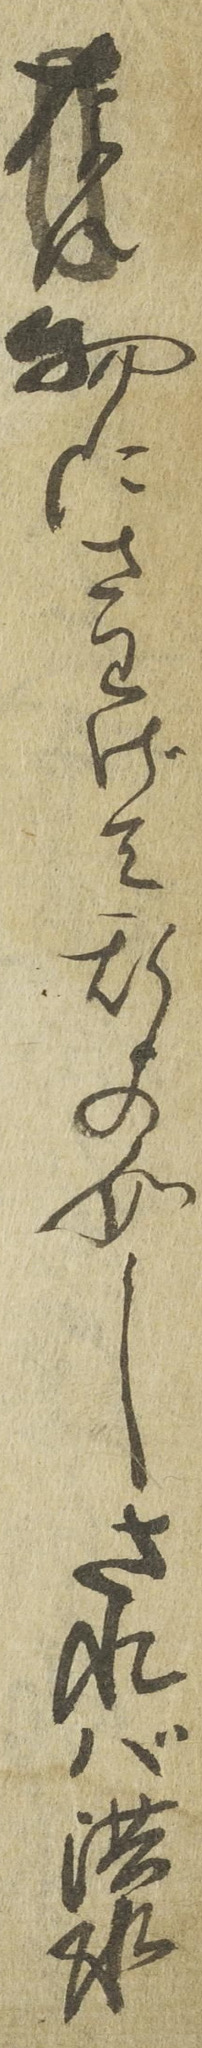物にさわげは斯の如しされバ洪水
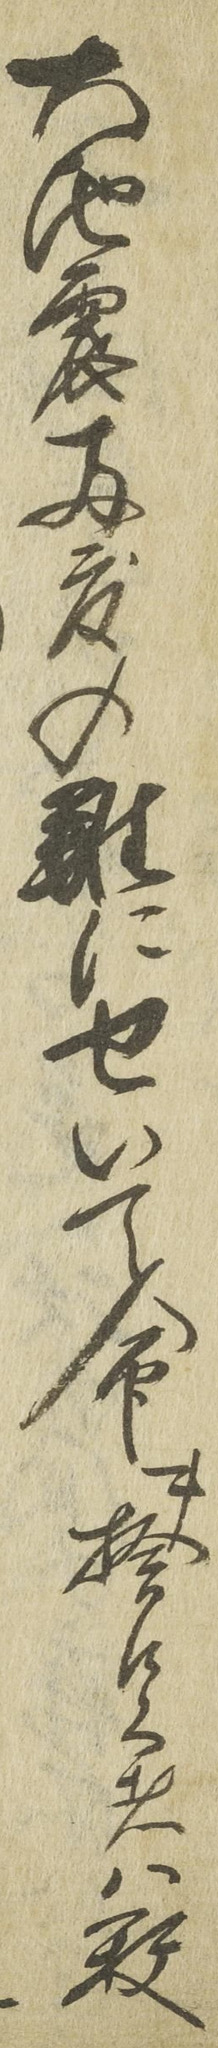大地震両度の難にせいて命ヲ捨ける者ハ数
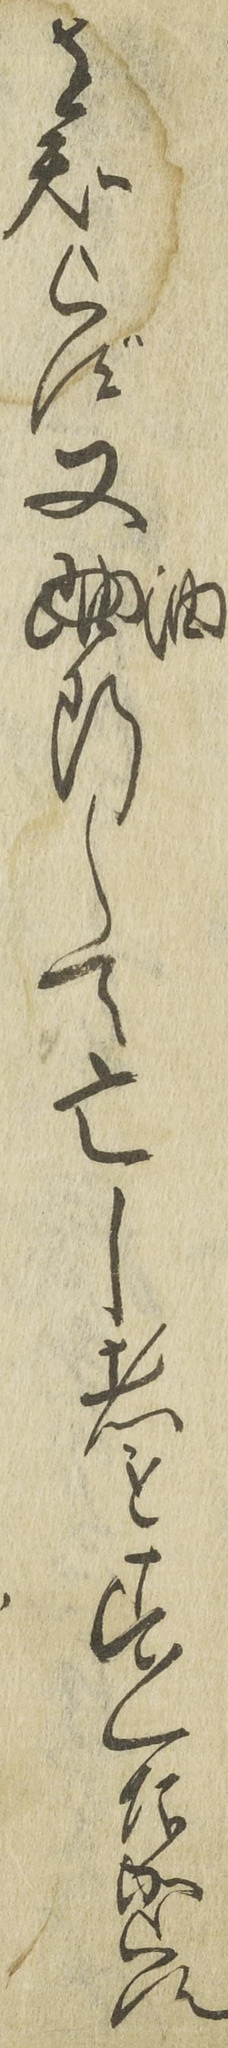を知らず又油断して亡し者もすくなからす
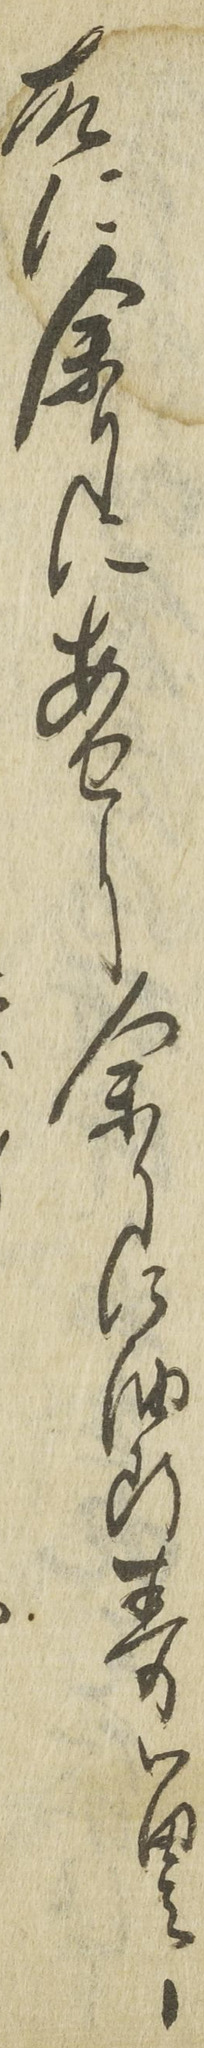故に余りにあせり余りに油断するは
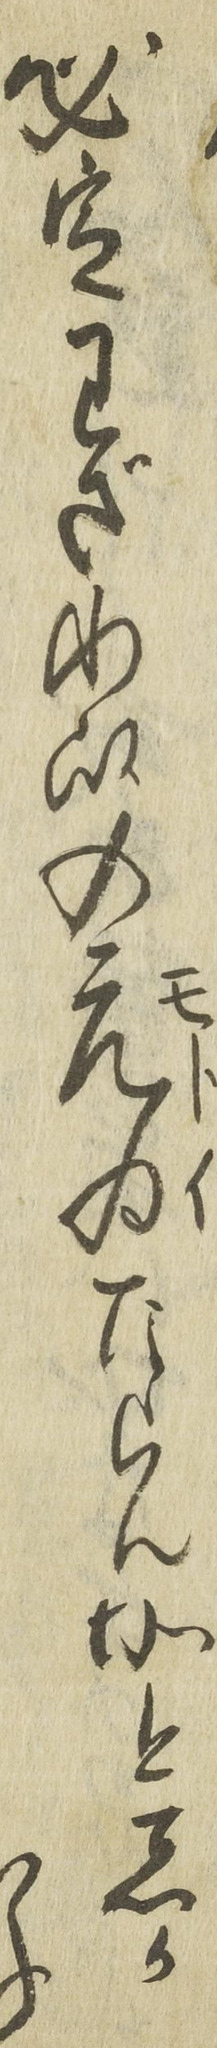必定わざわいの元為ならんかとしかいふ
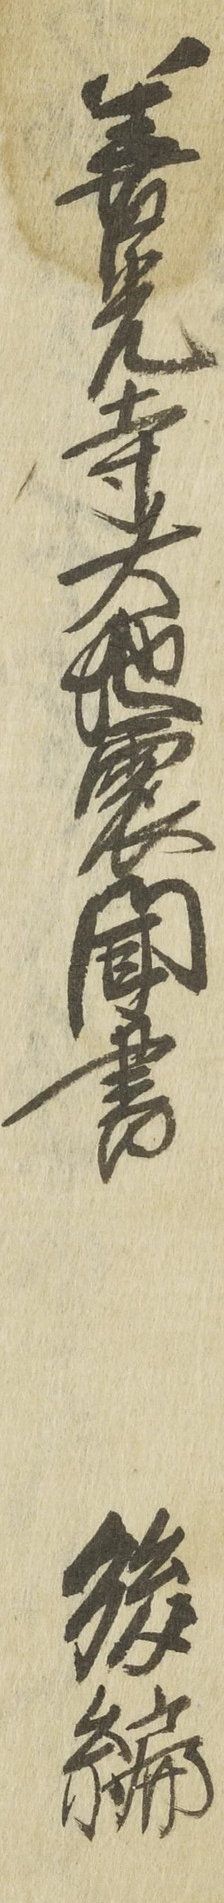善光寺大地震聞書後編
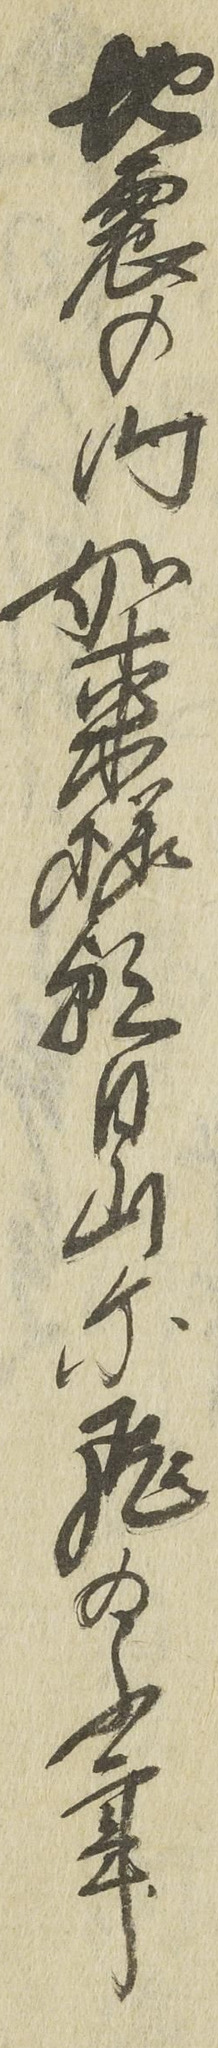地震の時如来様朝日山に飛給ふ事
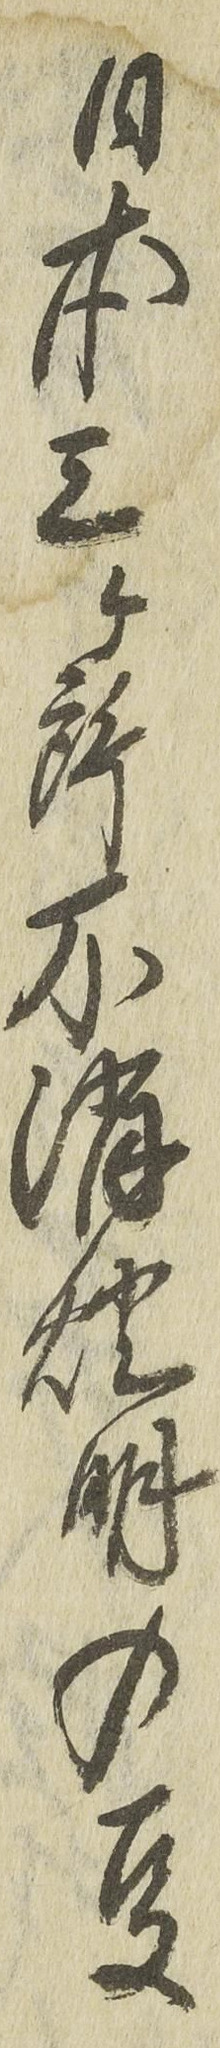日本三ケ所不消燈明の事
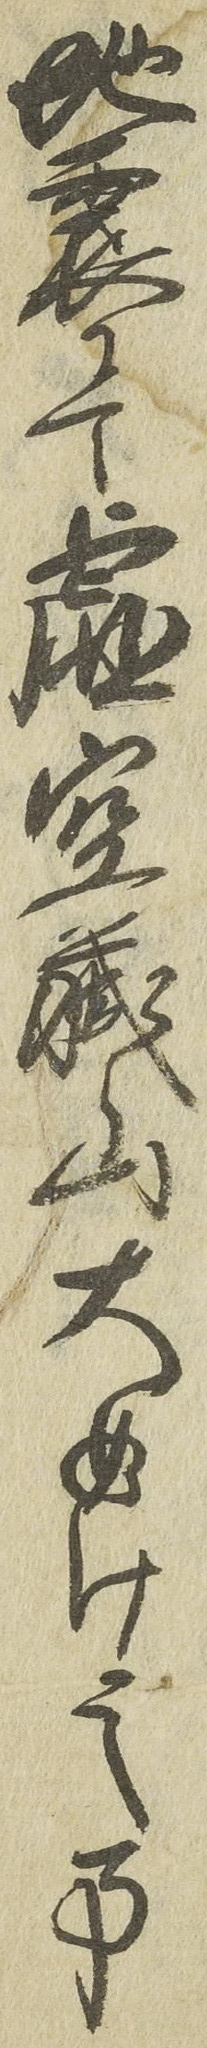地震にて虚空蔵山大ぬけ之事
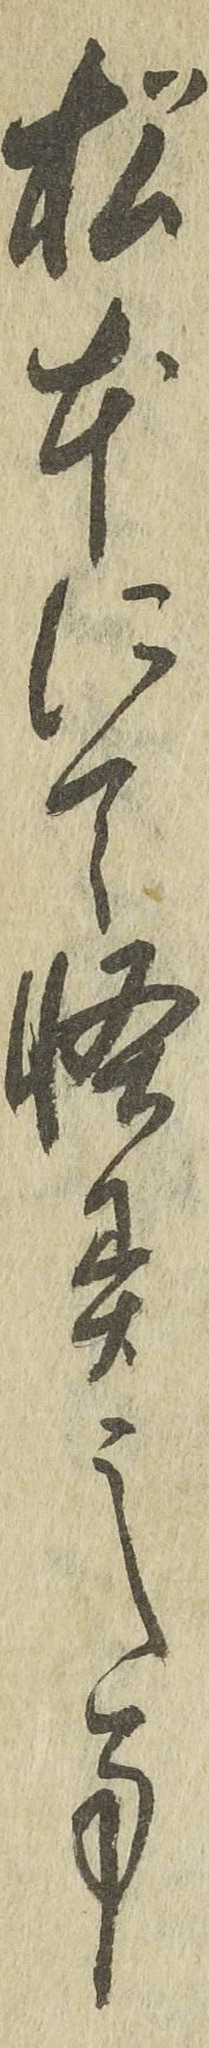松本にて怪異之事
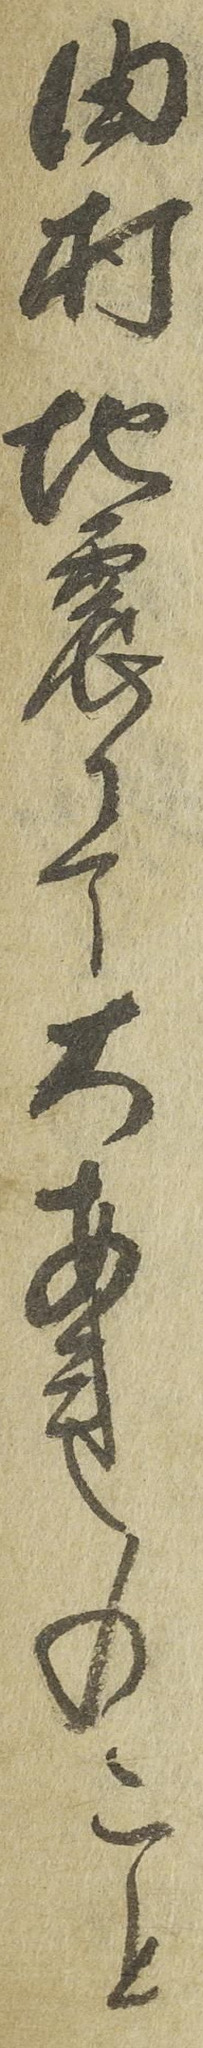由村地震にて大あれのこと
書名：善光寺地震聞書
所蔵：東京大学地震研究所図書室 Earthquake Research Institute Library, The University of Tokyo, JAPAN
